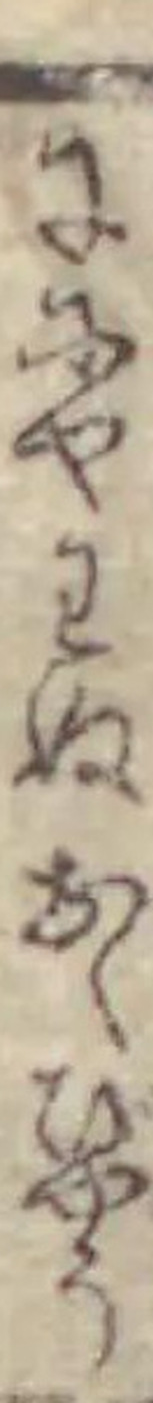ににやわぬおくびやう
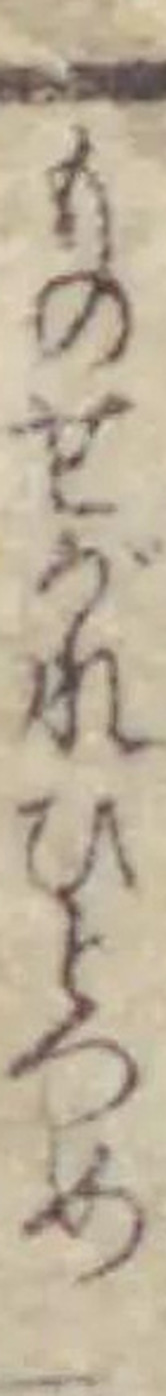ものせがれひとつめ
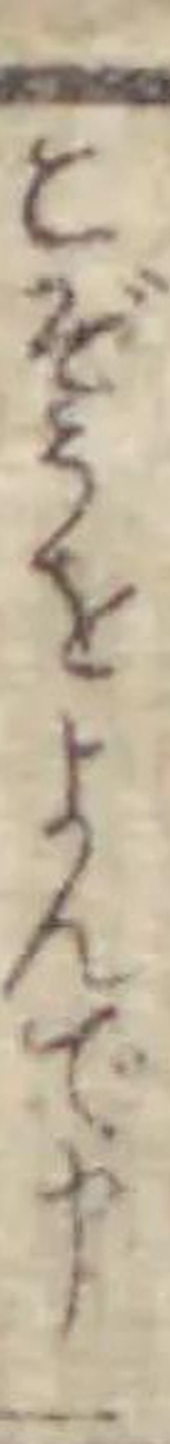こぞうをよんで申
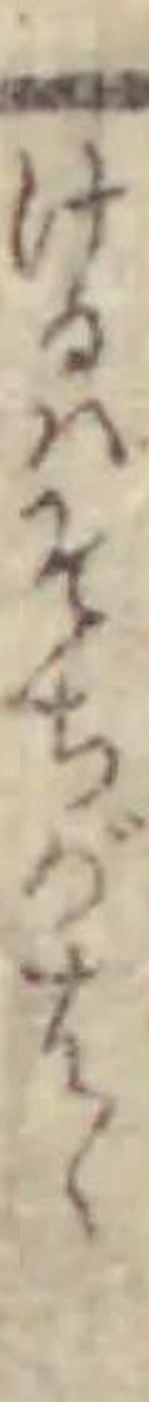けるはそちがはゝ
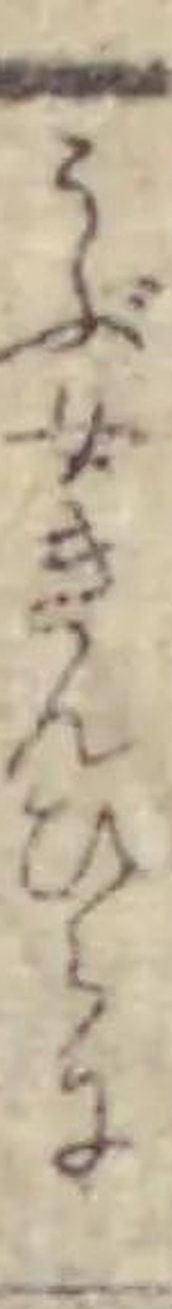うぶ女きんひらに
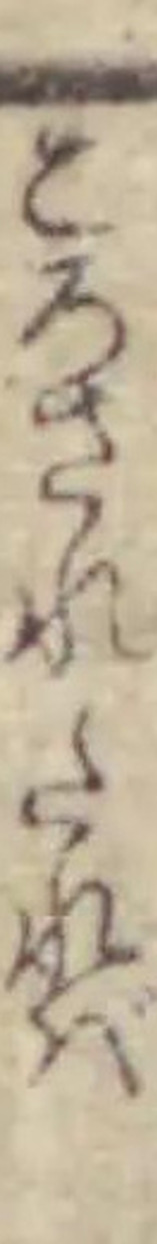ころされたれば
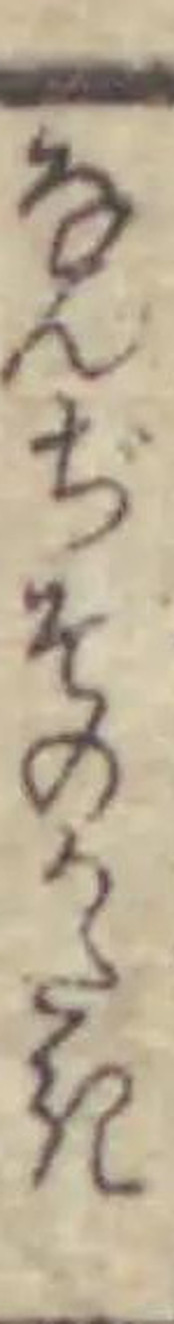なんぢそのかたき
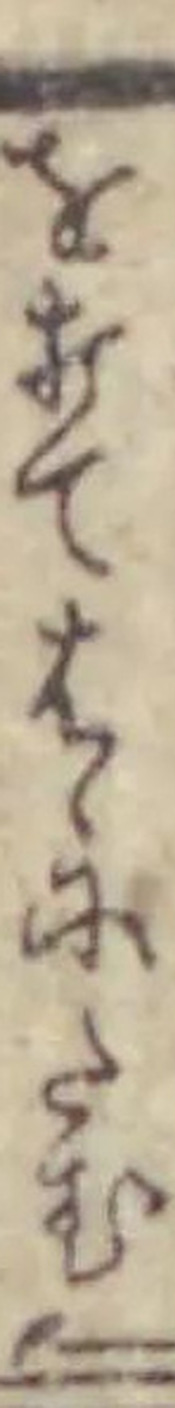を打てはゝにたむ
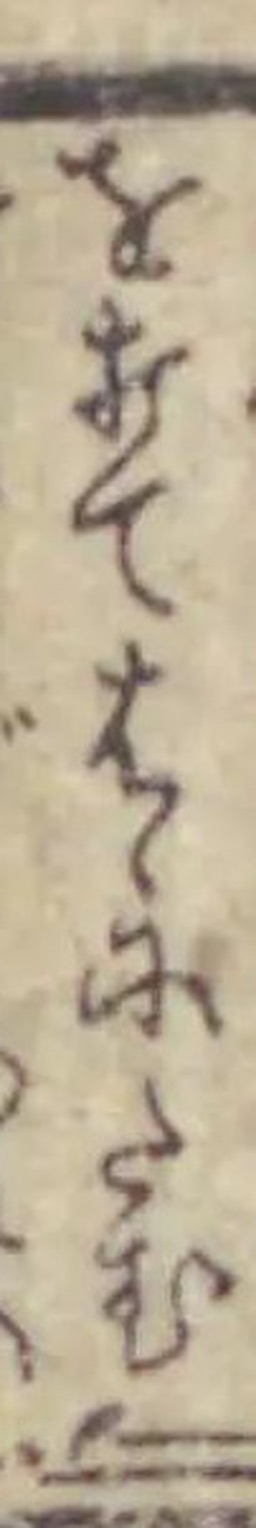を打てはゝにたむ
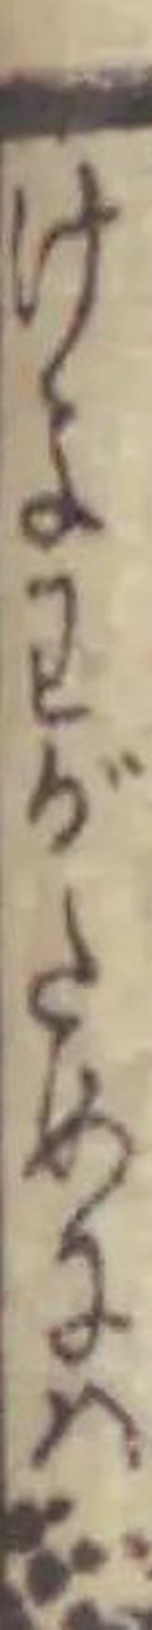けよわがためには
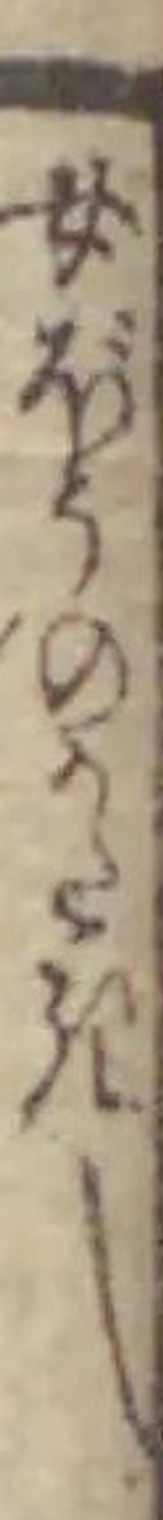女ぼうのかたき
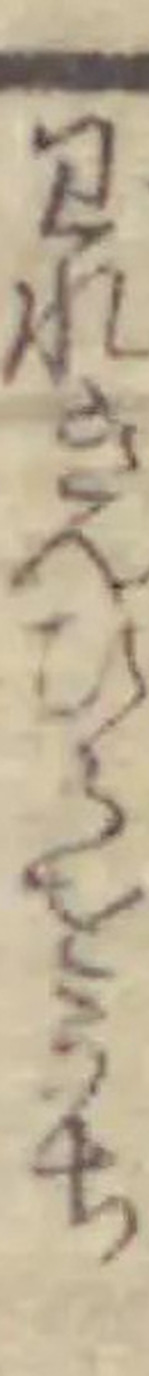われきんひらをうち
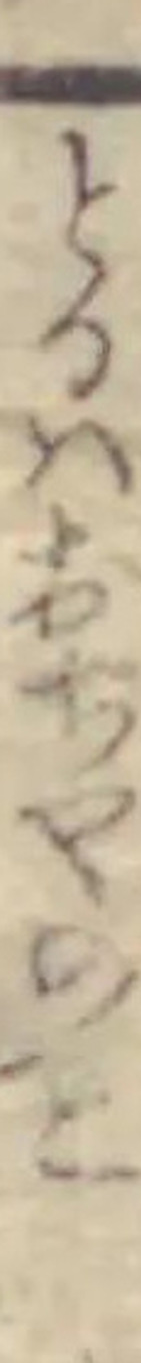とるはおちやのこ
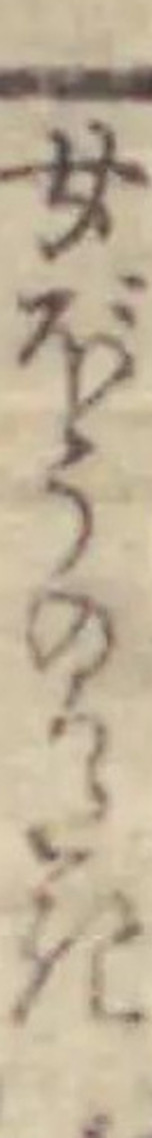女ぼうのかたき
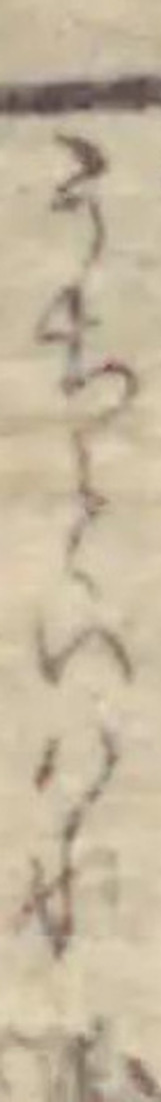うちといはれ
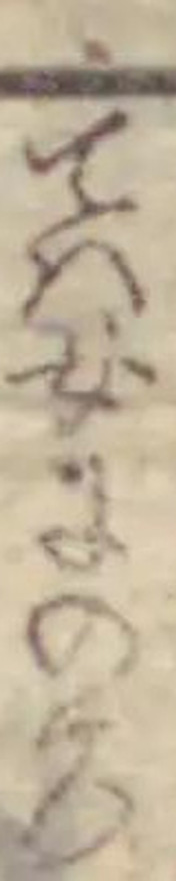れは女にのろ
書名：化物敵討 2巻
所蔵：国立国会図書館 National Diet Library, JAPAN
